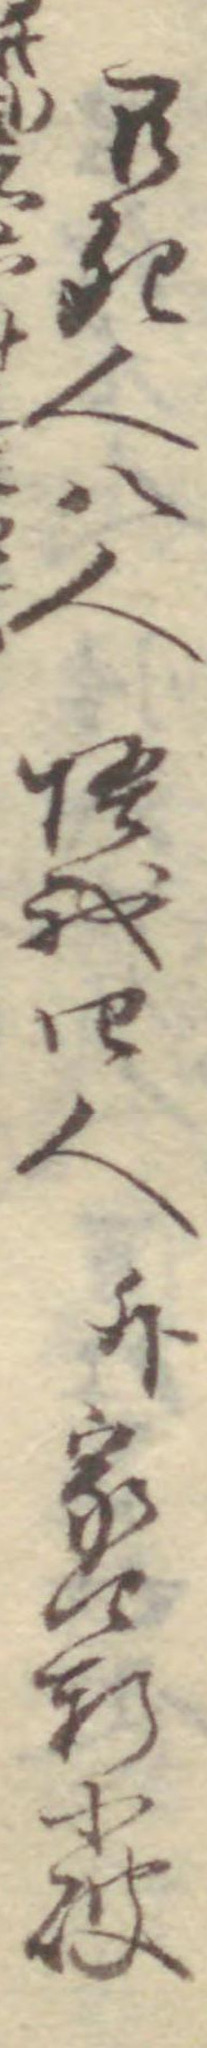即死人八人怪我四人外家四軒小破
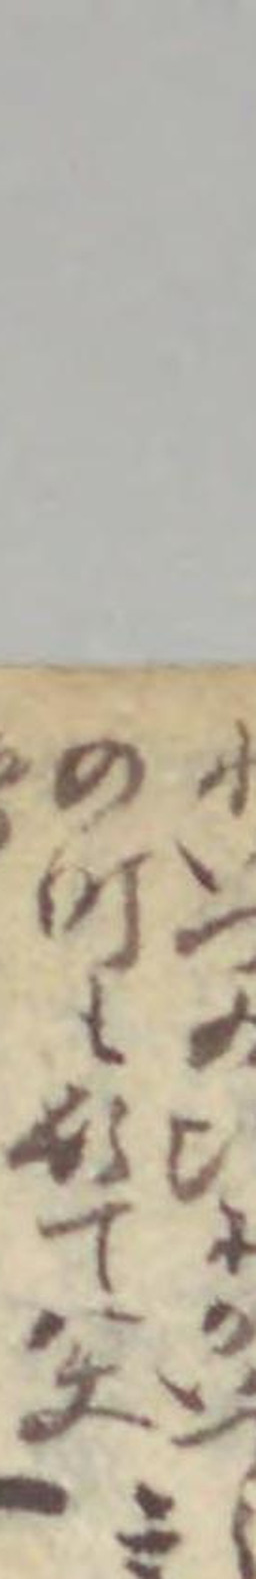の町も頓て八文
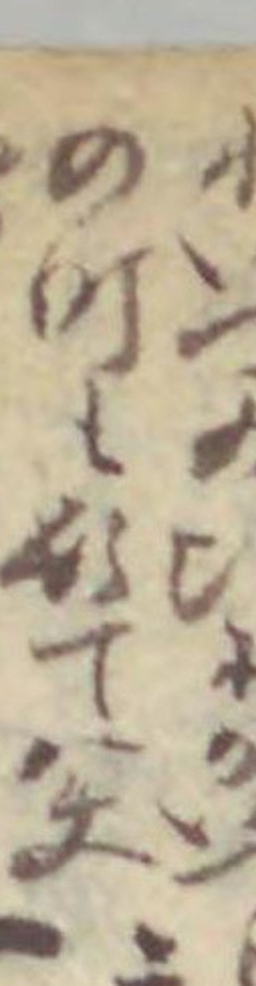の町も頓て八文
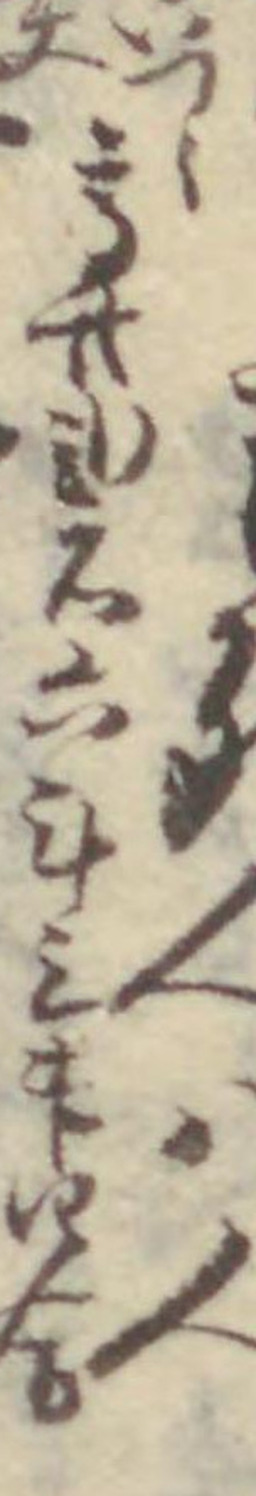高廿二石六斗三升四合
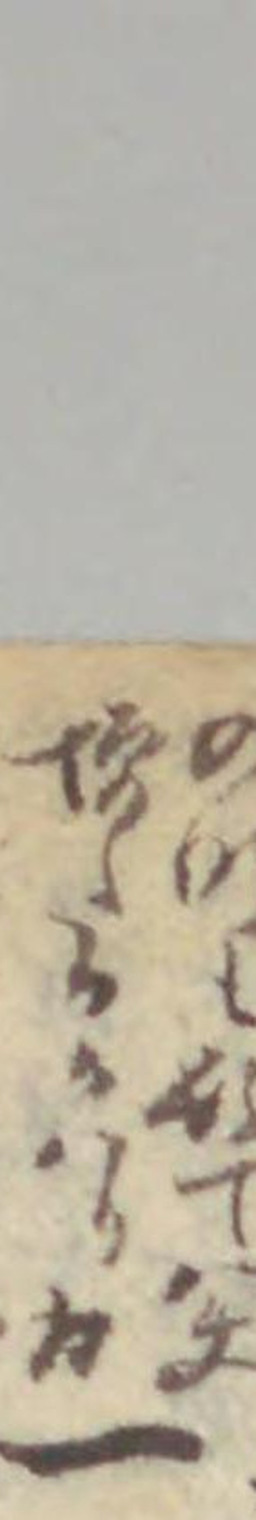増したるかハり力
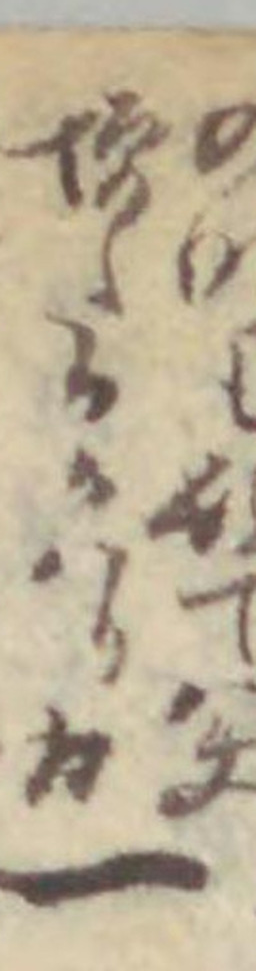増したるかハり力
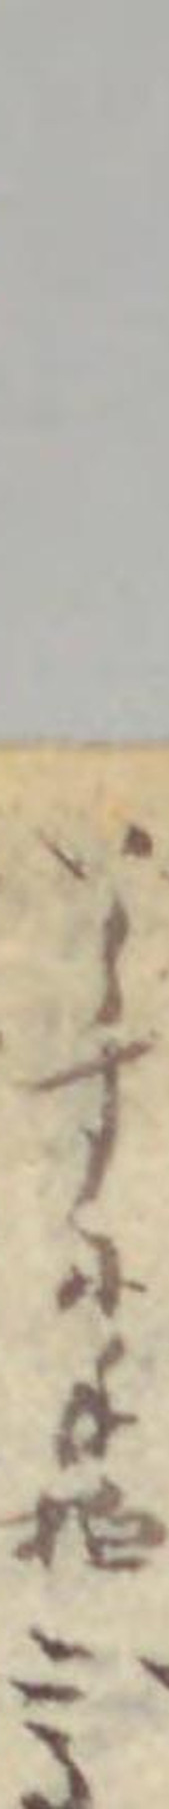いらすに手拍
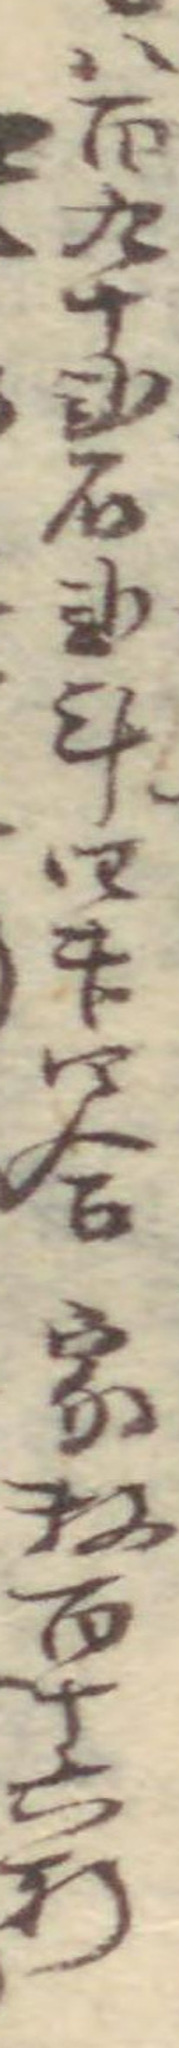高八百九十弐石弐斗四升四合家数百十六軒
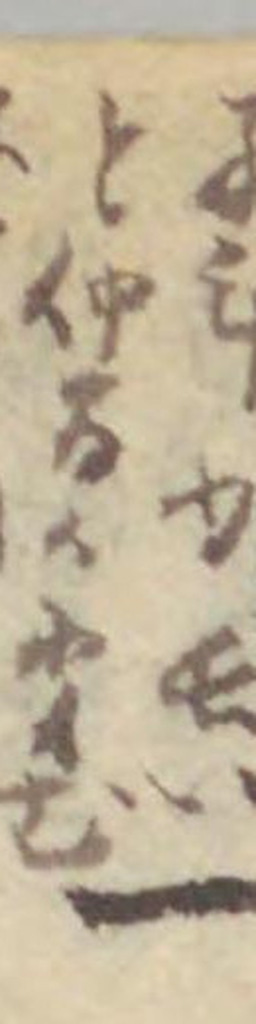と仲間かにくむ
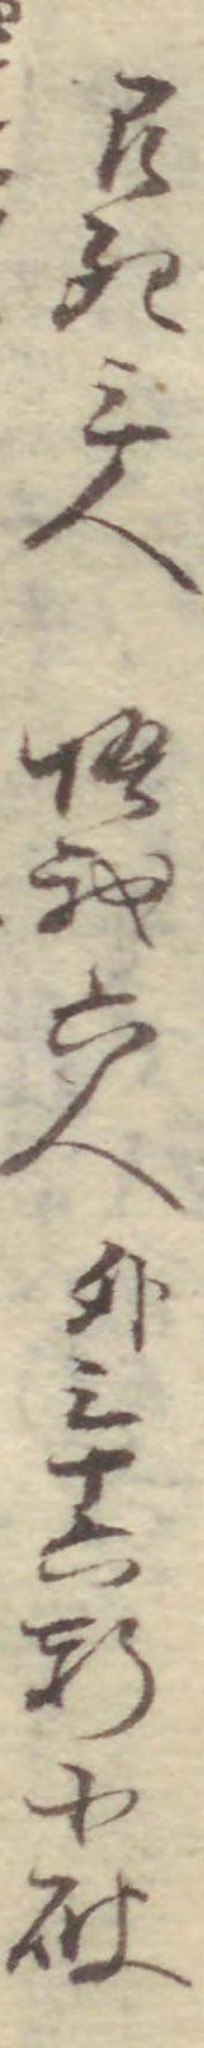即死人三人怪我六人外三十六軒小破
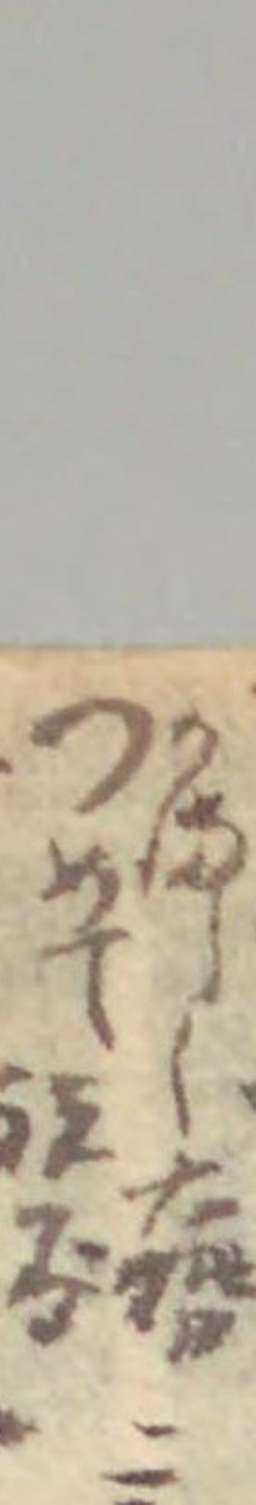つめて祝儀
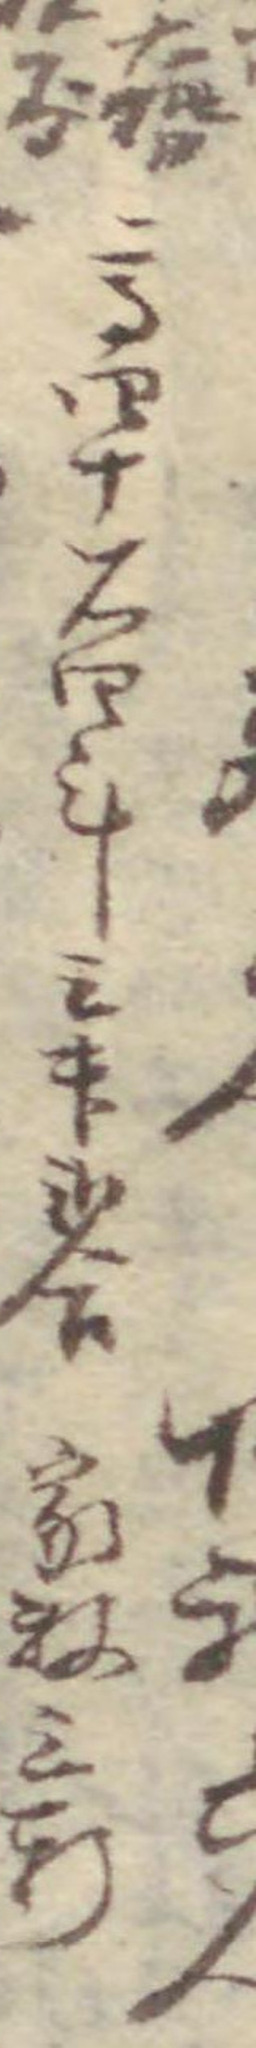高四十石四斗三升弐合家数三軒
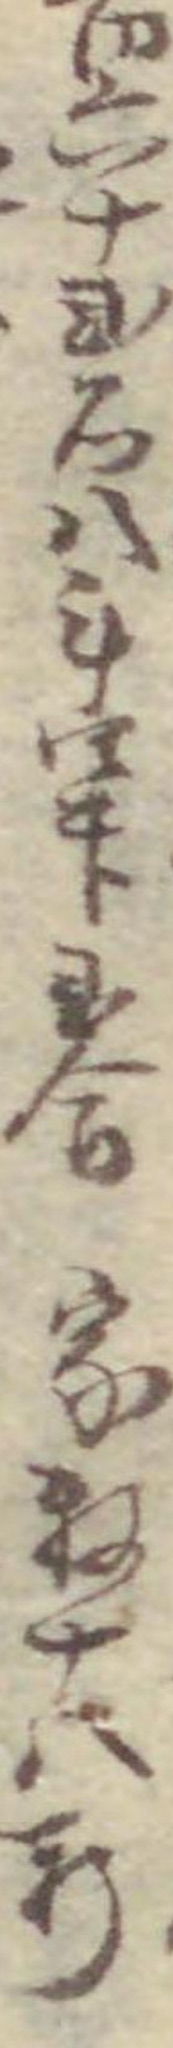高百六十弐石八斗四升弐合家数十八軒
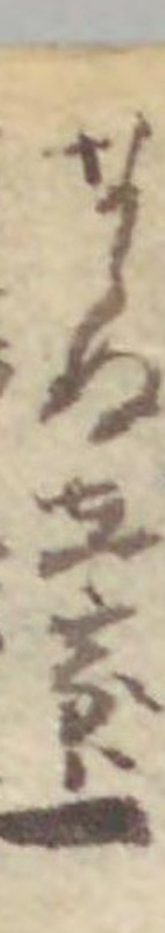ならぬ在家ハ
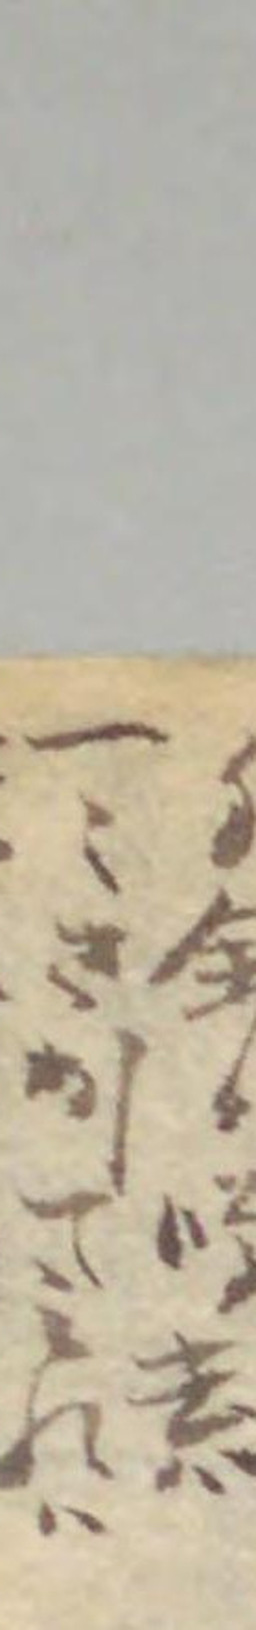一々さかしてミれハ
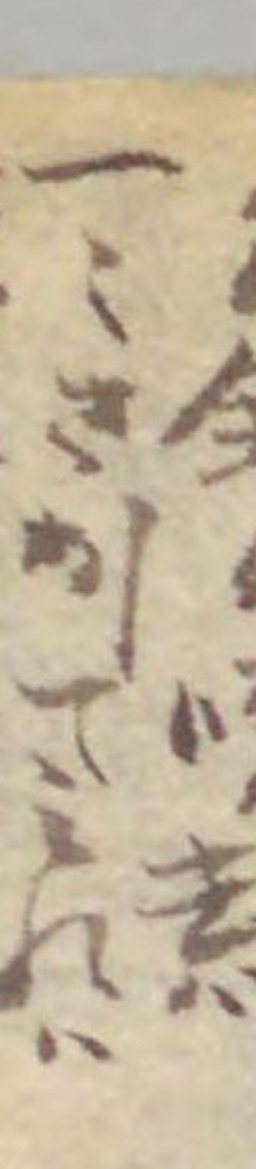一々さかしてミれハ
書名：鶯宿雑記. 巻199-200
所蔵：国立国会図書館 National Diet Library, JAPAN
